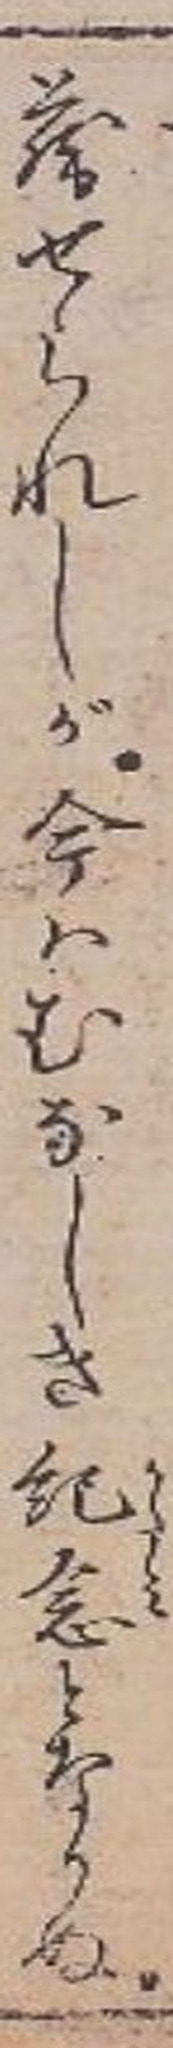蔵せられしが、今はむなしき紀念となりぬ、
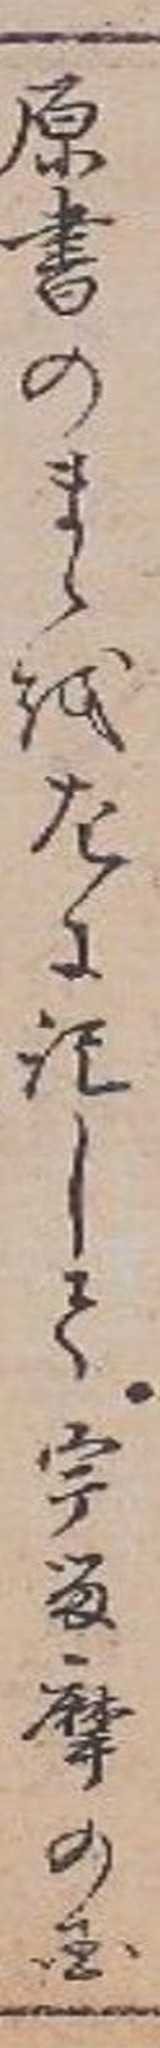原書のまゝを左に記して、宇留摩の国
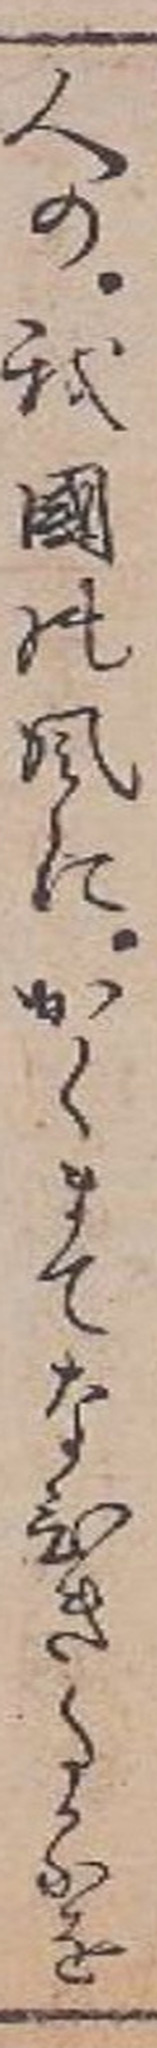人の、我国の風に、かくまてなひきたるを
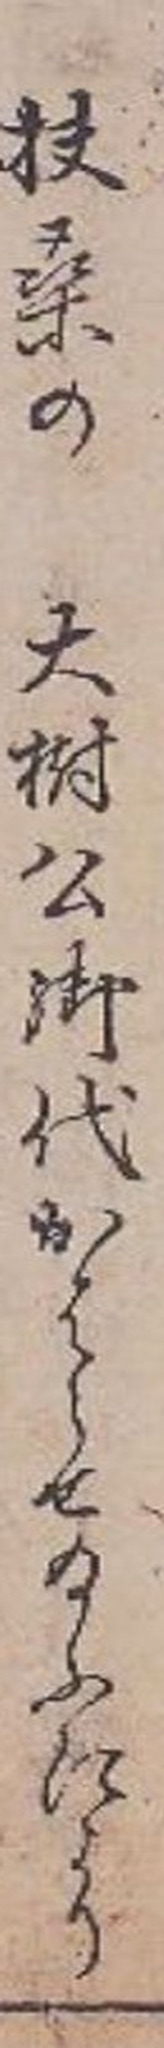扶桑の大樹公御代かはらせ給ふにより
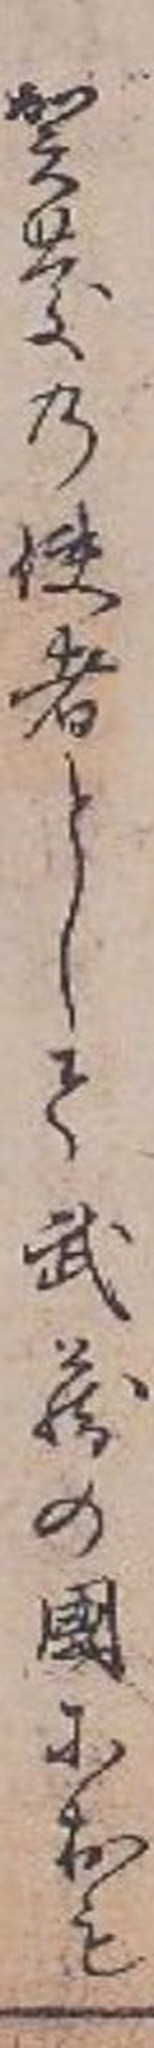賀慶の使者として武蔵の国におも
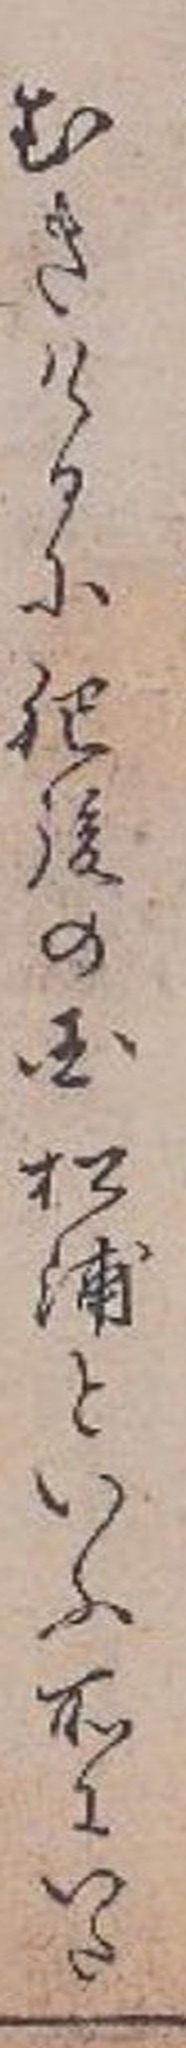むきけるに肥後の国松浦といふ所にいた
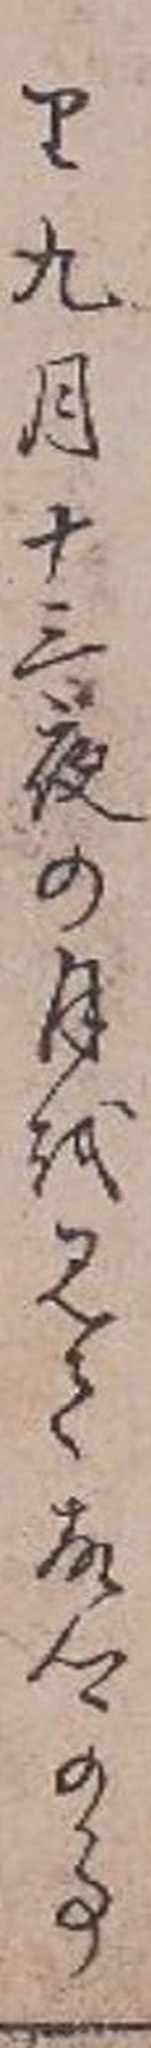り九月十三夜の月を見て故郷の事
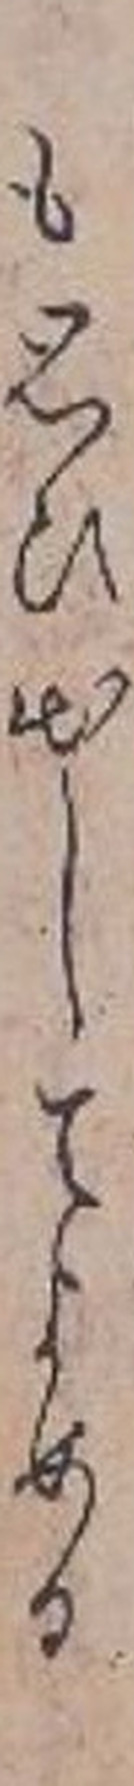も思ひ出してよめる

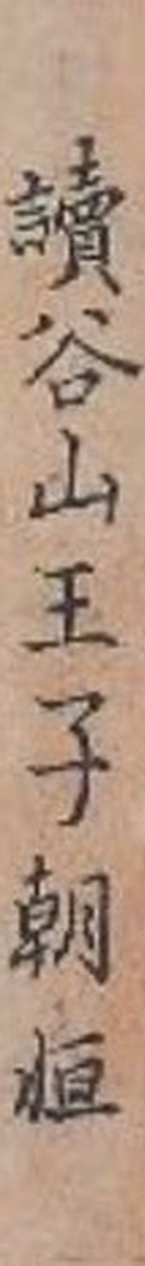読谷山王子朝恒
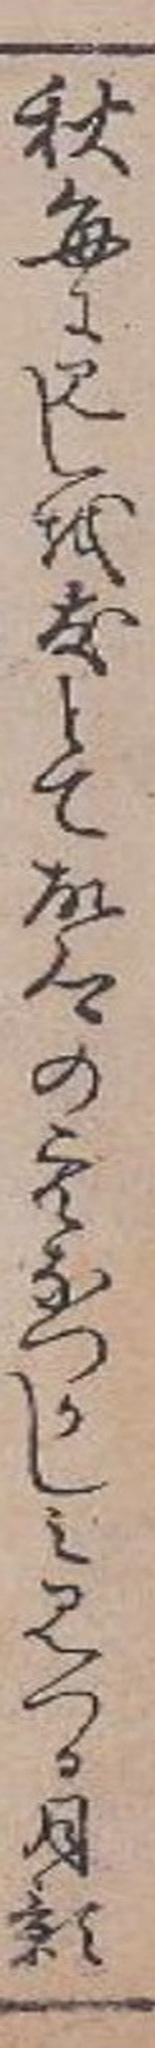秋毎に見しを友とて故郷の空なつかしみ見つる月影
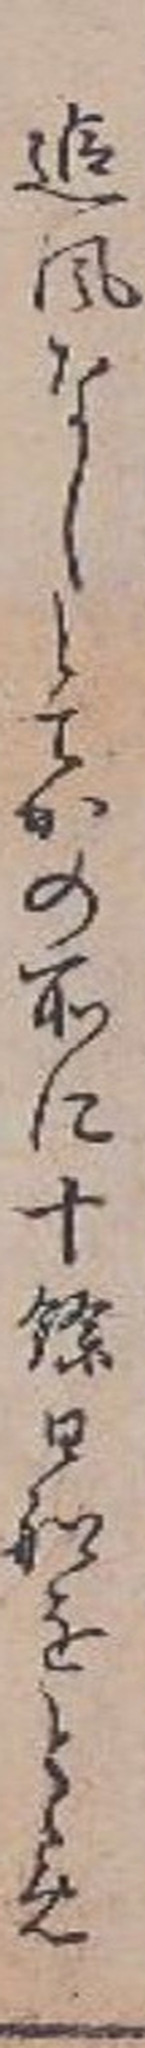追風なしとてかの所に十余日船をとゝめ
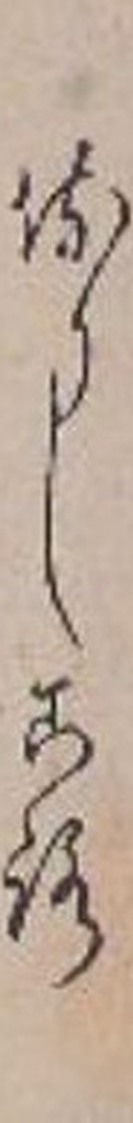侍りしころ
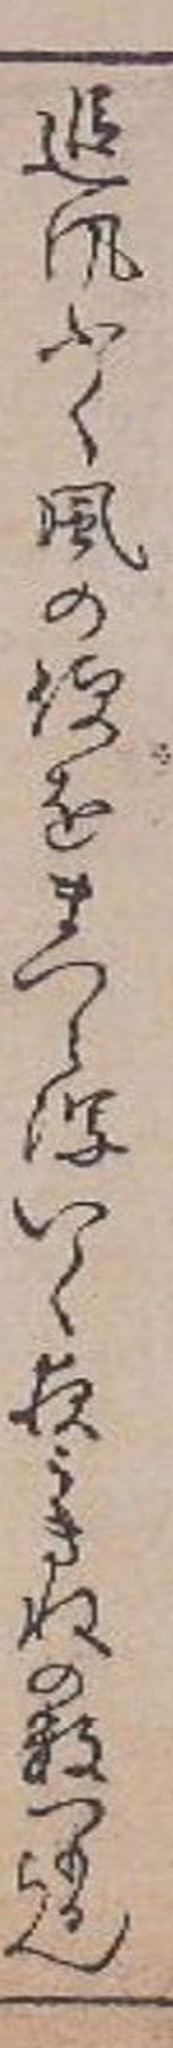追風ふく風の便をまつら潟いく夜うきねの数つもるらん
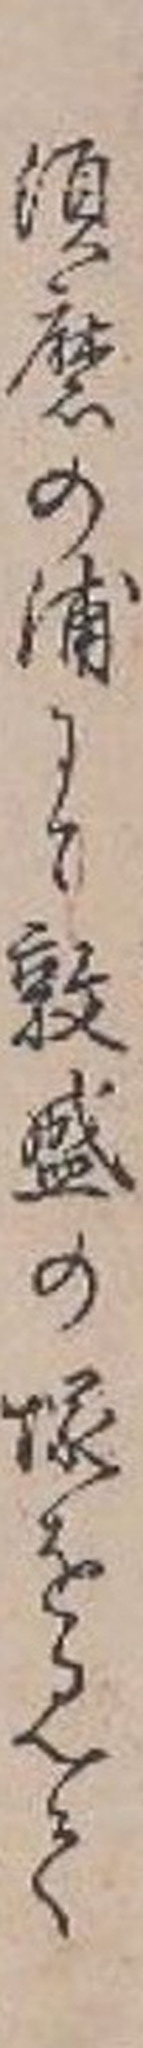須磨の浦にて敦盛の塚を見て
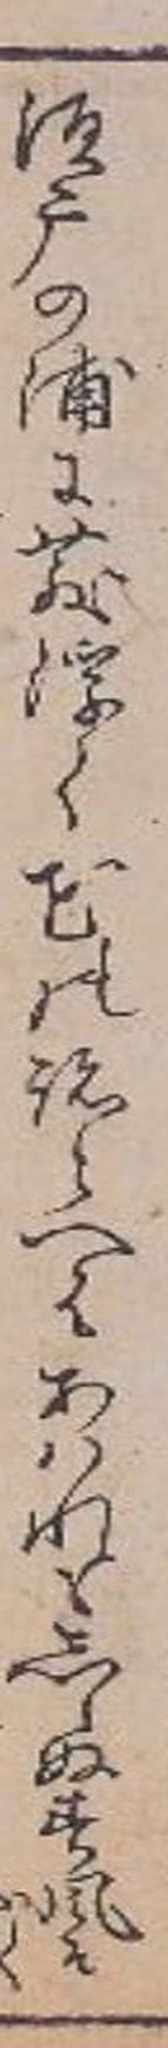須磨の浦に散浮く花の跡とへはあはれもしらぬ春風そふく
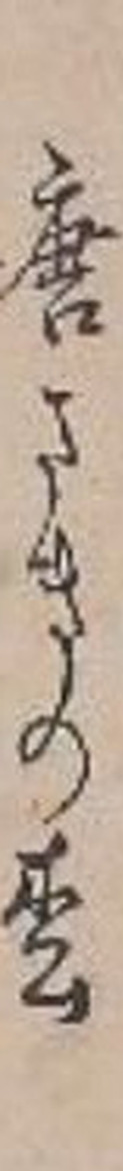唐さきの松
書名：琉球談
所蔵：University of the Ryukyus Library
